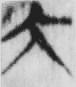大
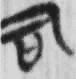司
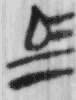馬
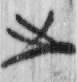之
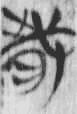歲
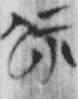𫵖
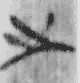之
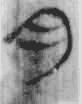月
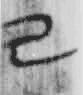己
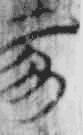亥
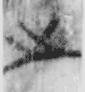之
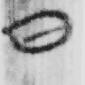日
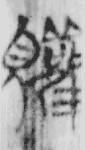觀
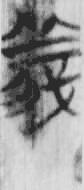義
